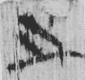之
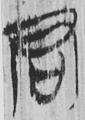君
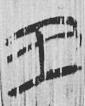王
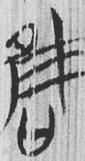唯
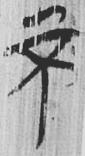不
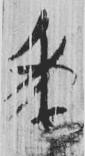年
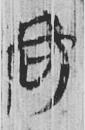可
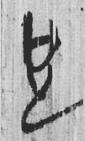也
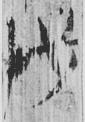戊
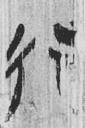行
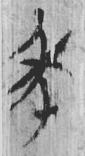年
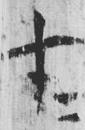七十
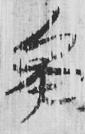矣
